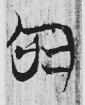含（今）
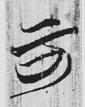可
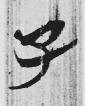子
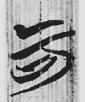可（何）
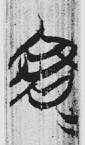舍（舍余）
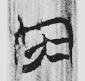含（今）
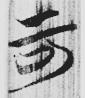可
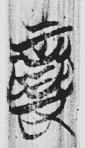婁（鶹）
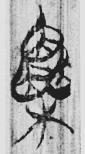○（鷅）
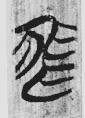飛
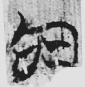含（今）
